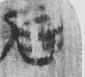君
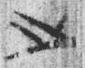之
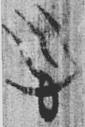○（順）
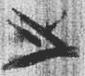之
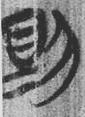則
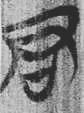君
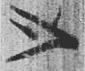之
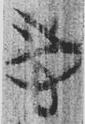志
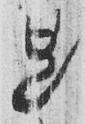也
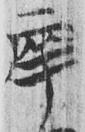兩
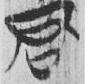君
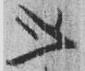之
